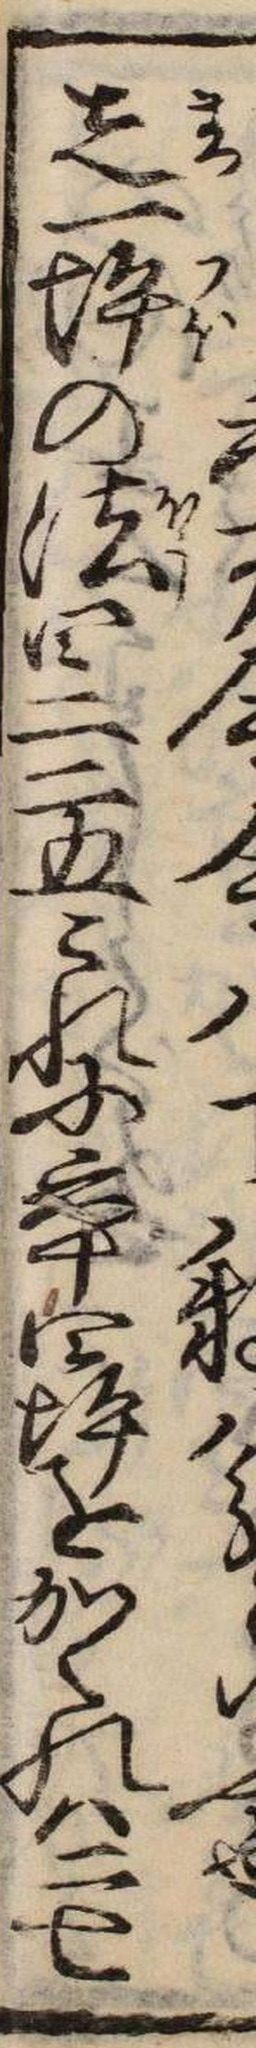先一坪の法四二二五これに六十四坪をかくれは二七
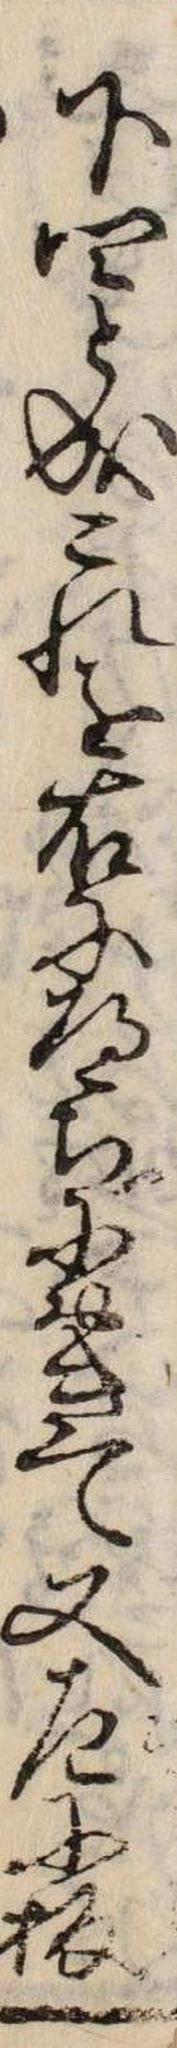下四と成これを右にへちにおきて又左に板
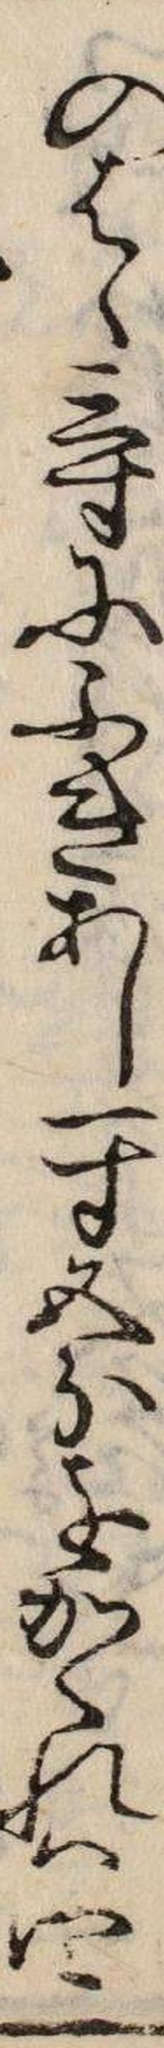のはゝ三寸にふきあし一寸五分をかくれは四
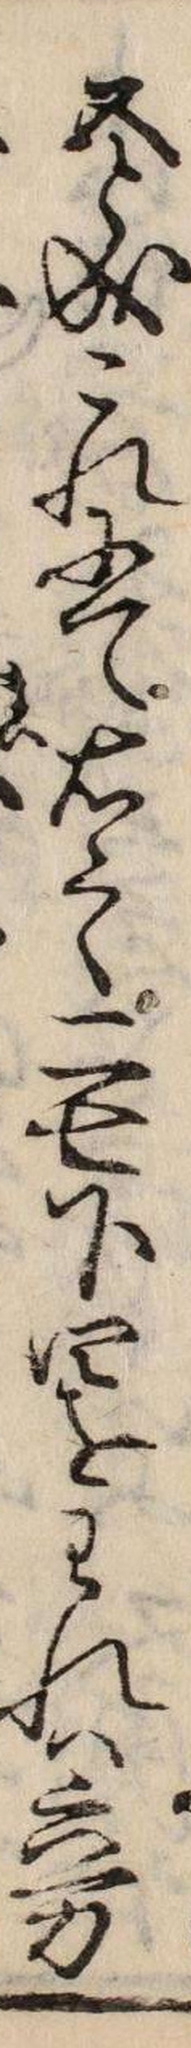五と成これにて右之二七下四をわれは六万
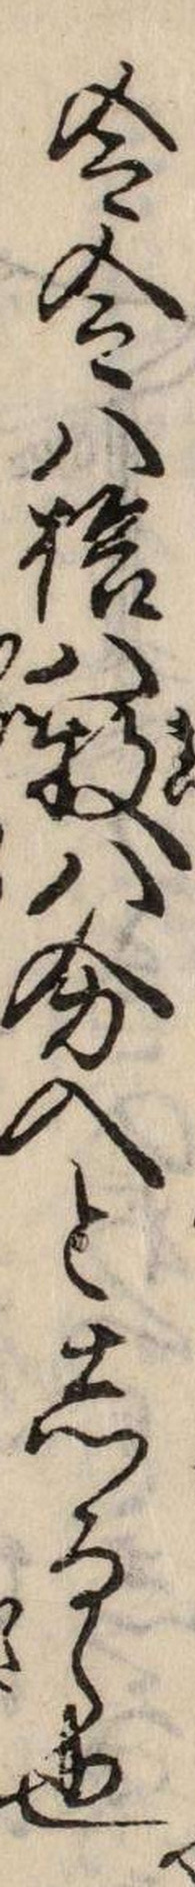令令八拾八枚八分入としるゝ也
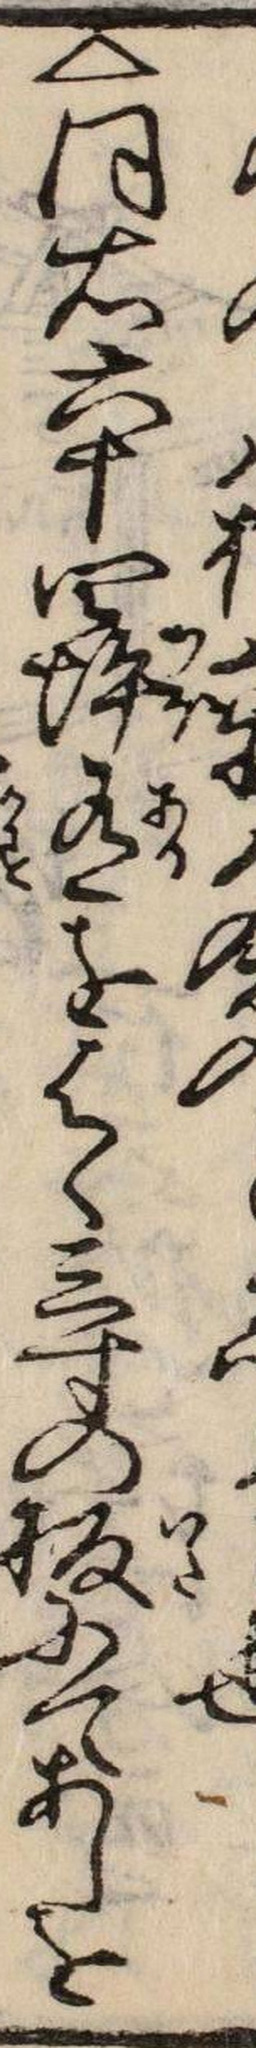△同右六十四坪有をはく三寸の板にてあしを
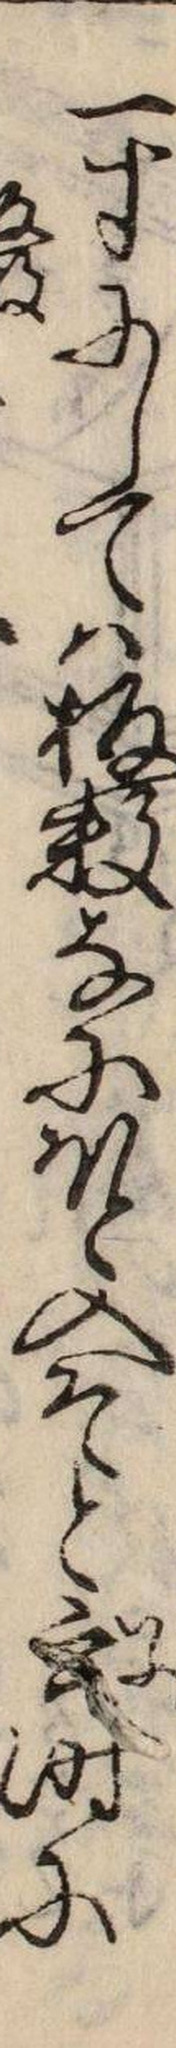一寸にしては板数なにほと入そと言時に
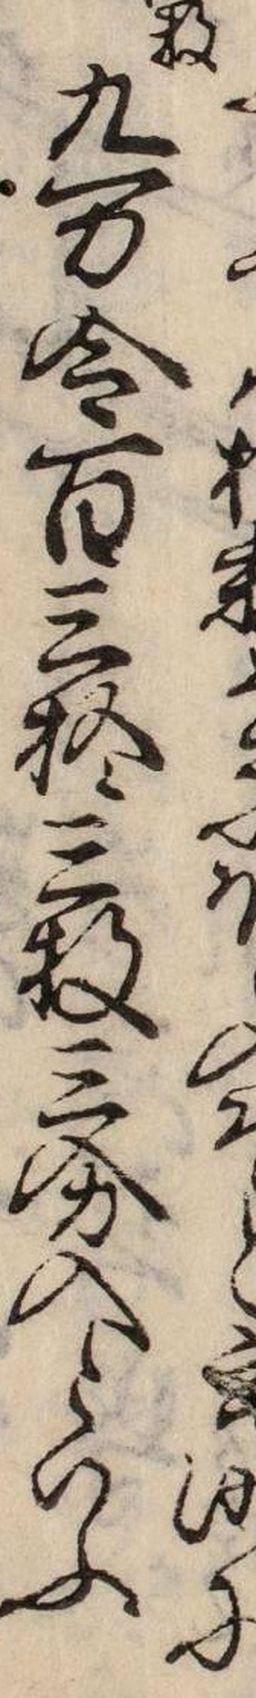板数九万令百三拾三枚三分入といふ
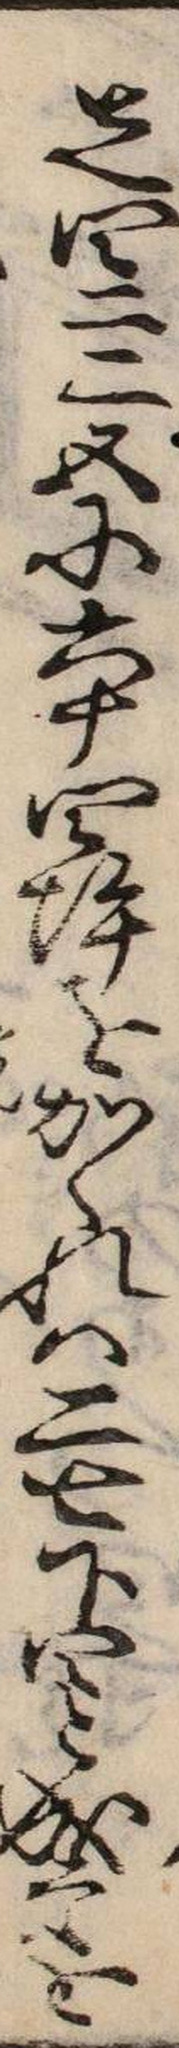先四二二五に六十四坪をかくれは二七下四と成◼︎を
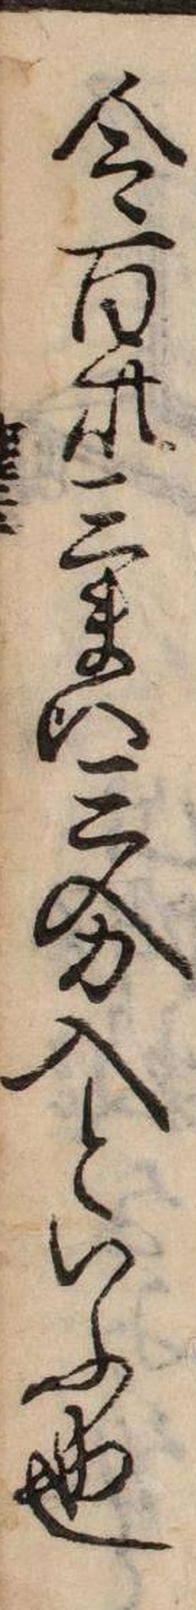令百丗三まい三分入といふ也

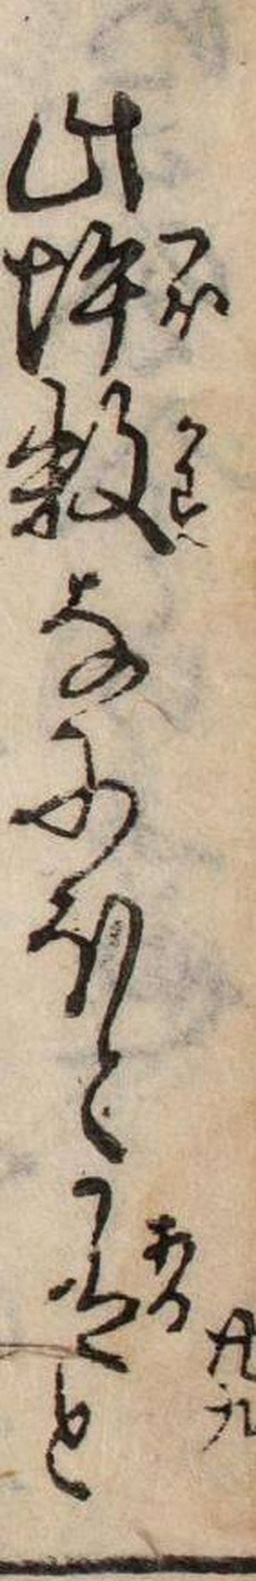此坪数なにほと有と
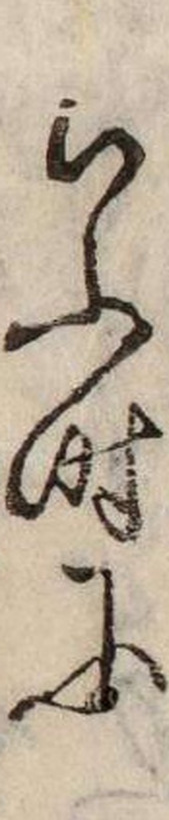いふ時に
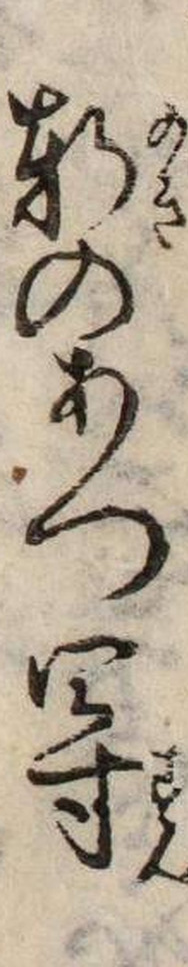軒のあつ四寸
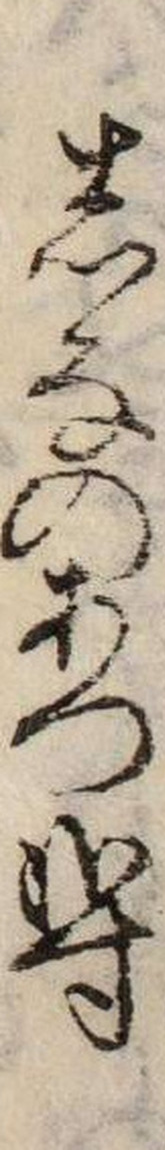しなのあつ弐寸
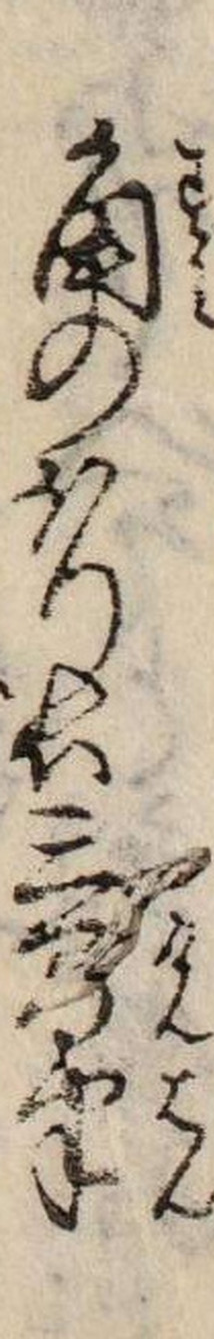角のほり長三間半
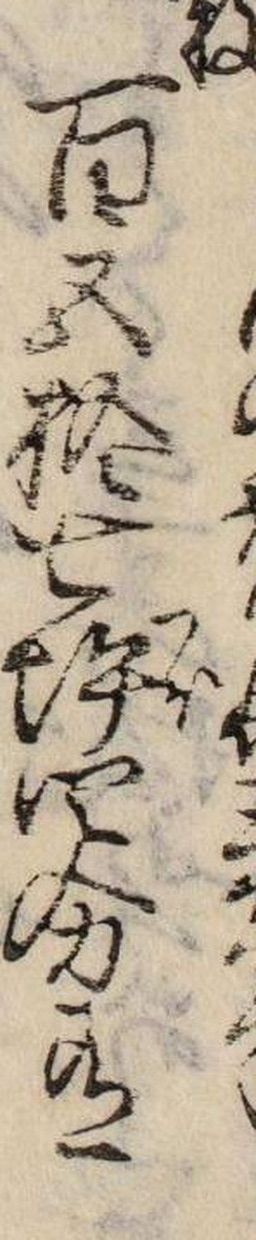百五拾七坪四分有
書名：塵劫記（寛永11年自跋、京都府立京都学・歴彩館追貴8）
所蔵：京都府立京都学・歴彩館 国文学研究資料館
